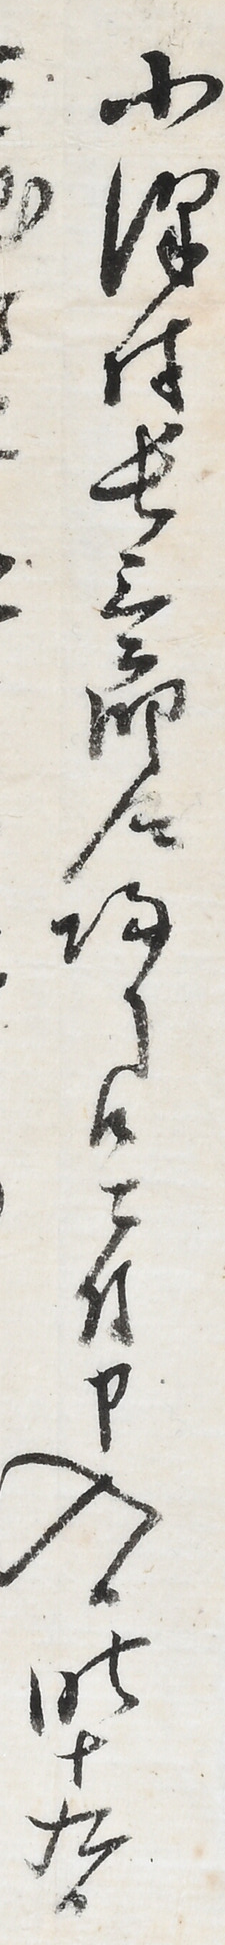小沢村長三郎に帰し候ニ付申入候昨十九日
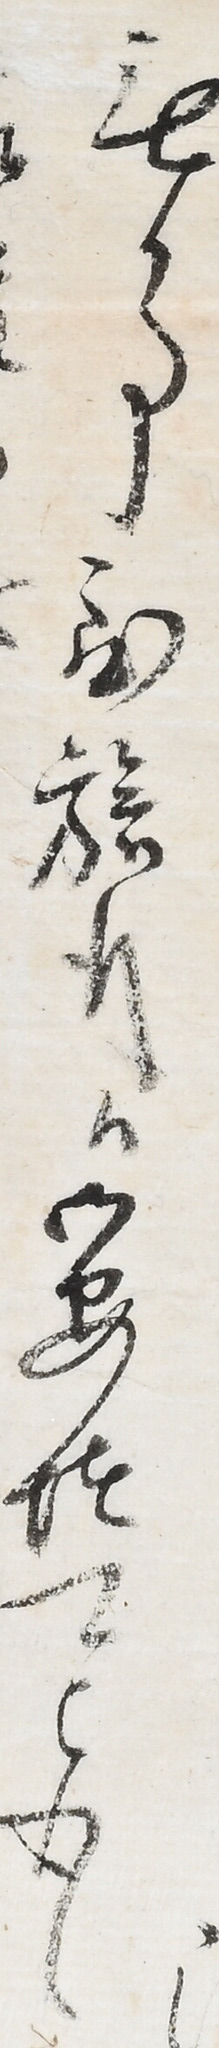無事致旅行候御安堵可被成候
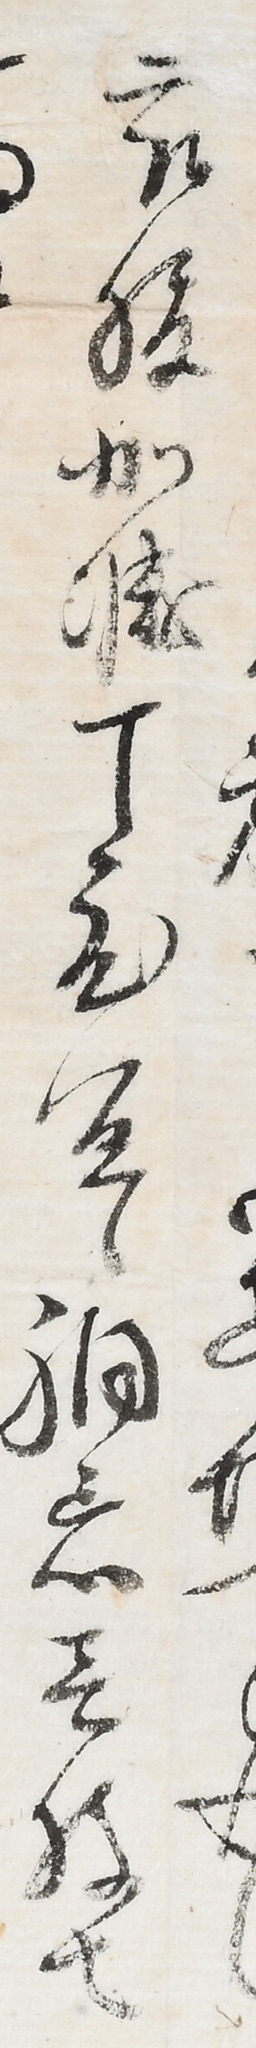衣服加掛丁度宜候胴着壱枚七
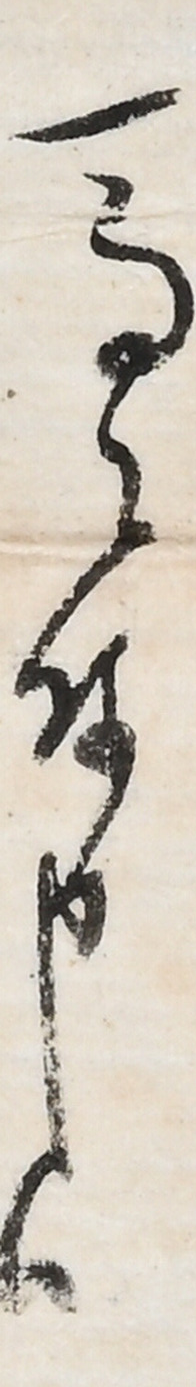馬ニ付申候
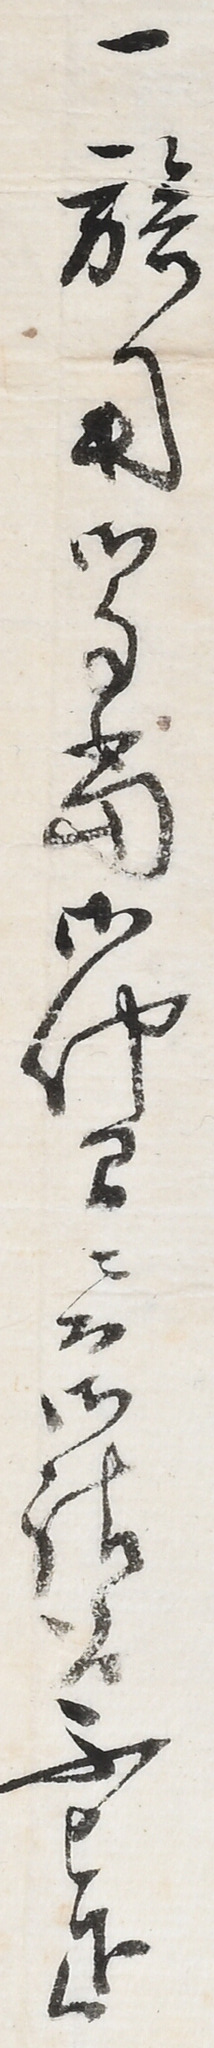一旅用御手当御仲間ニ而御請取不ヒ疋
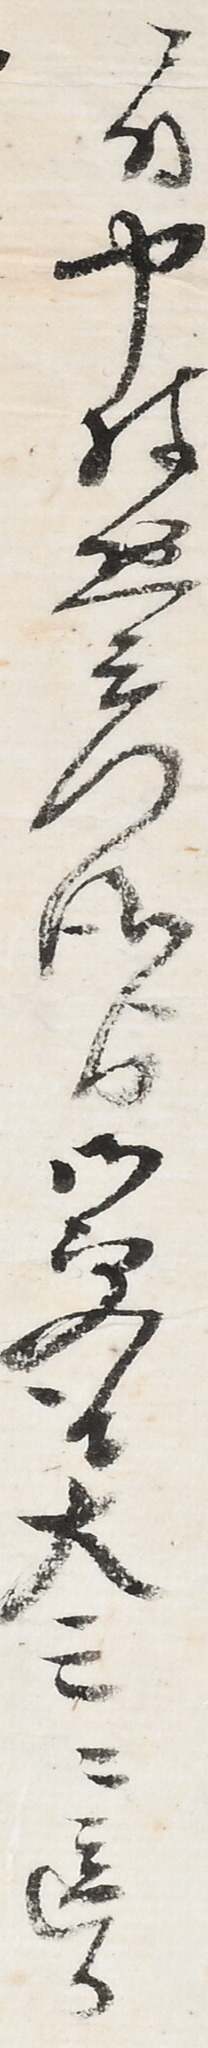ニ付中村興左衛門様より御受取大ミニ送り
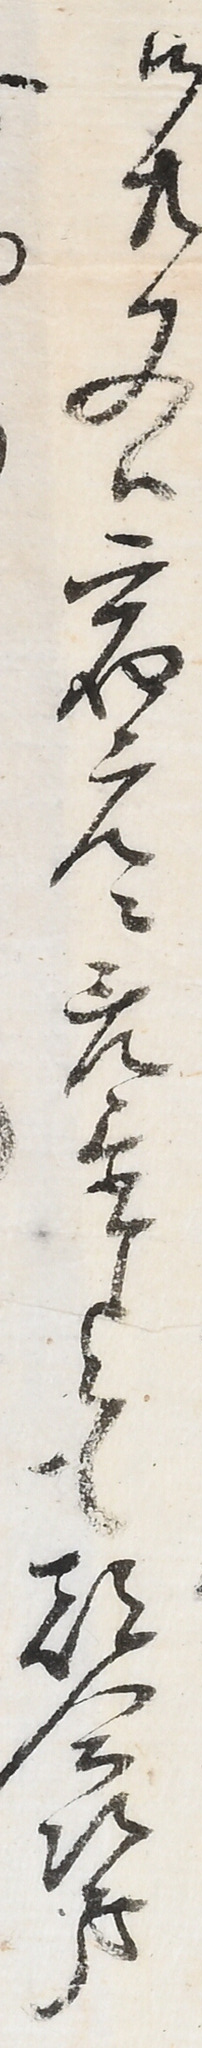候共又ハ宿元ニ差置候とも都合次第
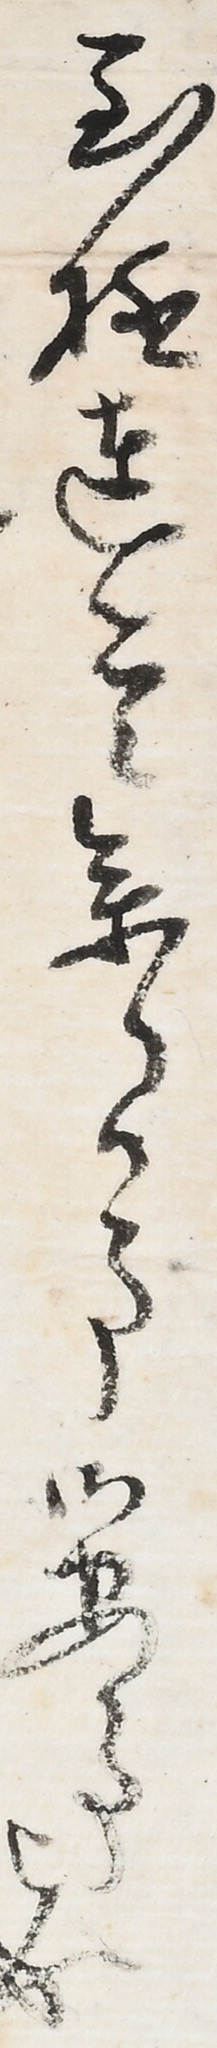至極達とし参り候事御安事被成
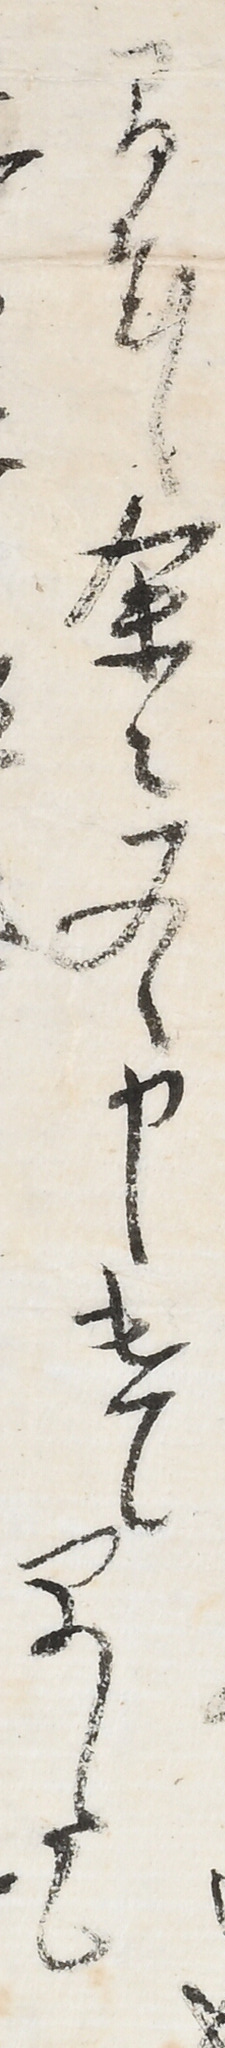間出候余々又々申遣候早々も
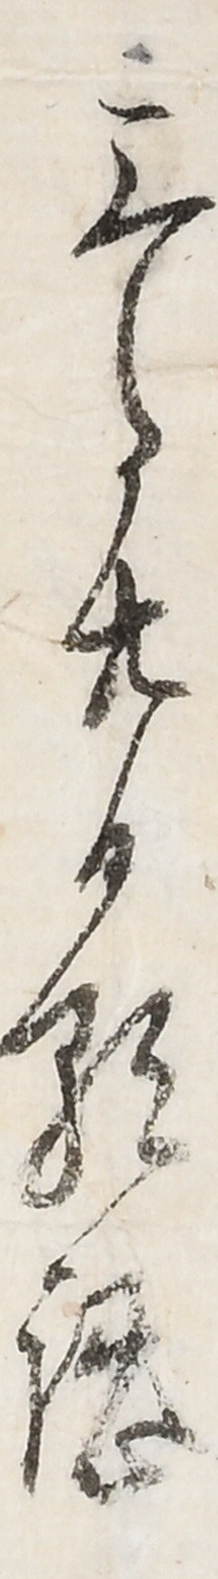三月廿日朝認
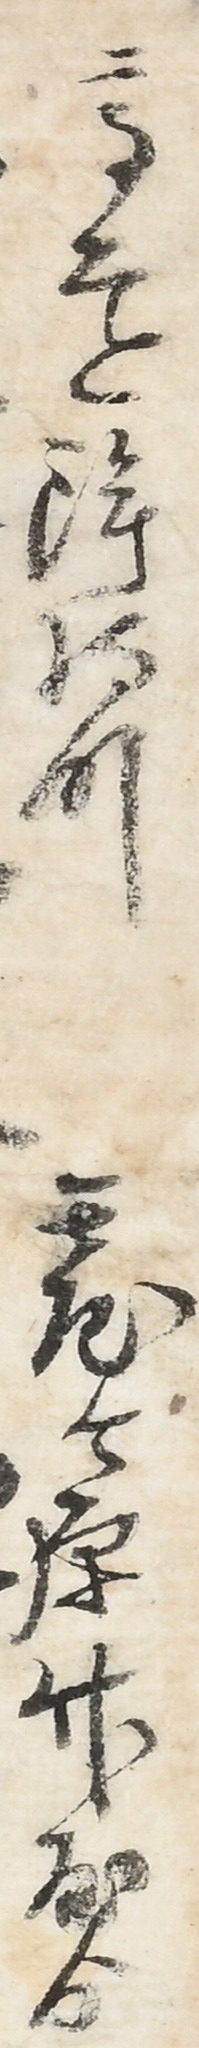高遠鉾持町台ケ原竹屋より
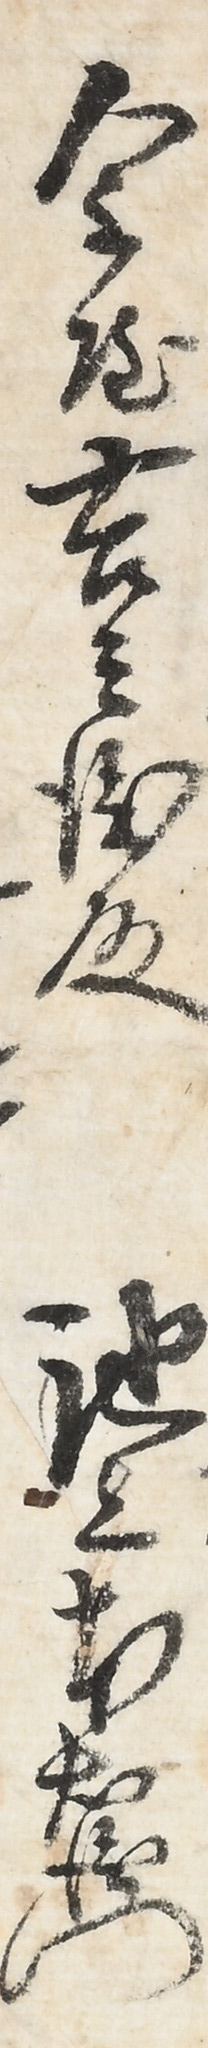金屋吉兵衛殿池上本右衛門
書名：（書状）
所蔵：伊那市立高遠町図書館・合同会社AMANE
